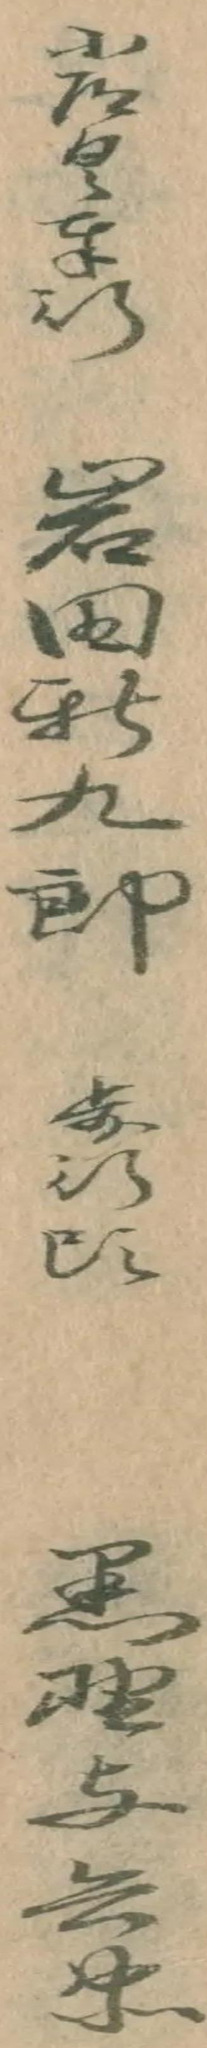小道具奉行岩田新九郎歩行頭黒野与兵衛

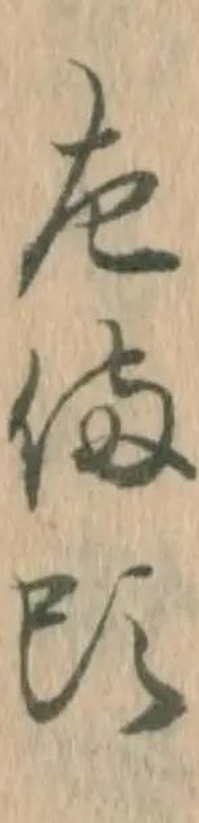左備頭
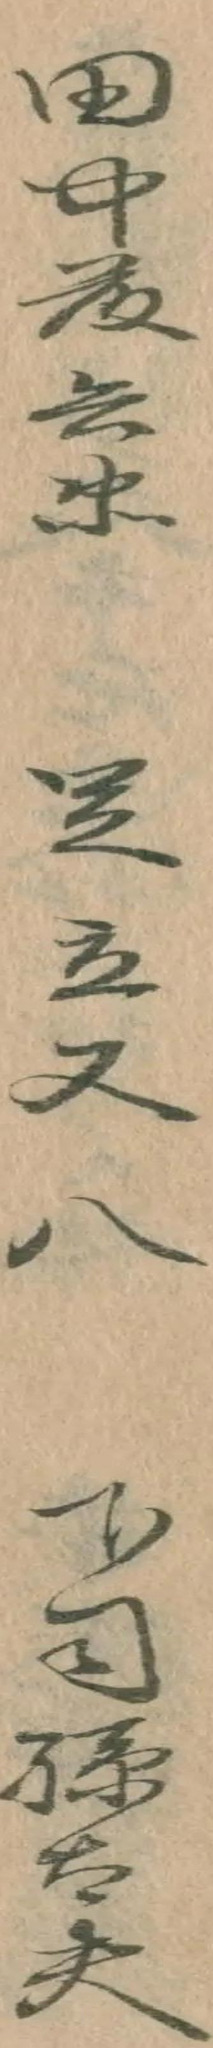田中藤兵衛足立又八下司孫太夫
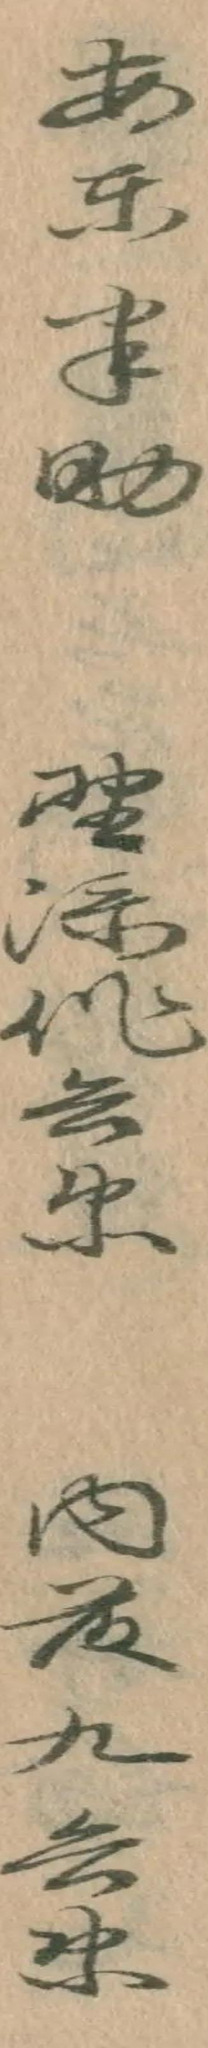安東半助野添作兵衛内藤九兵衛
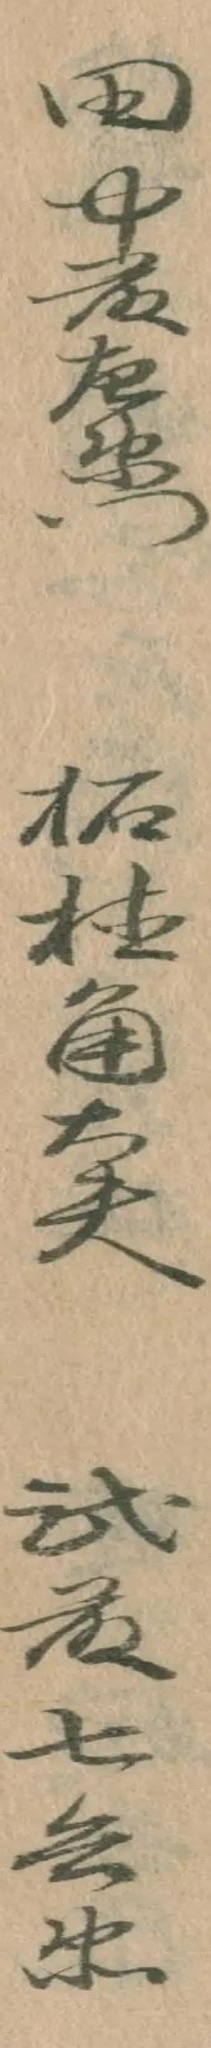田中藤左衛門拓植角大夫武藤七兵衛
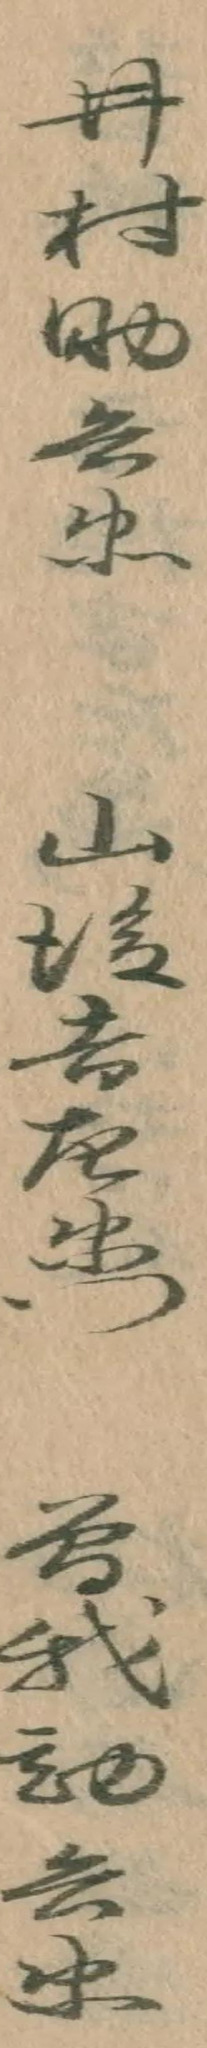井村助兵衛山後吉左衛門曽我勘兵衛
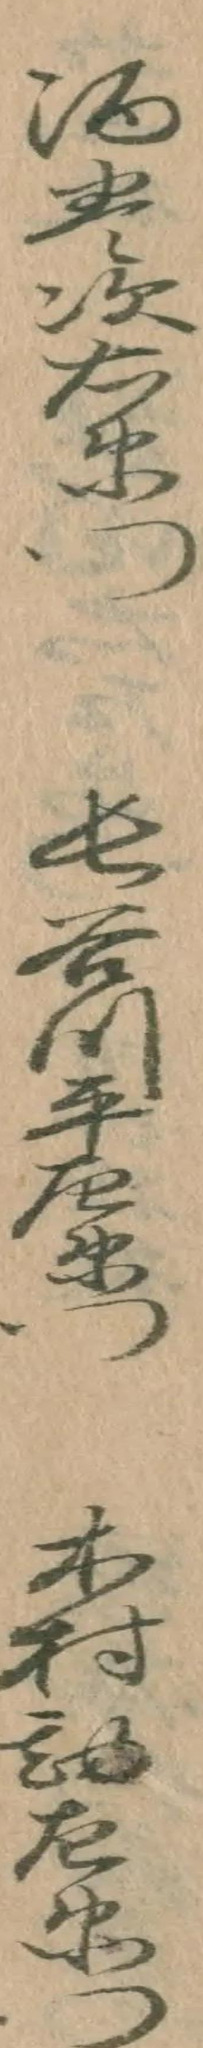酒巻次右衛門長谷川平左衛門木村勘左衛門
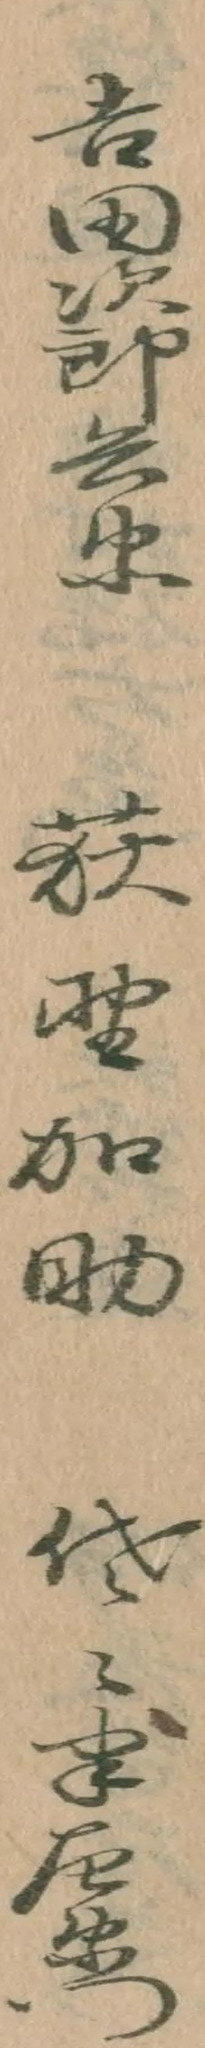吉田次郎兵衛荻野加助佐々半左衛門
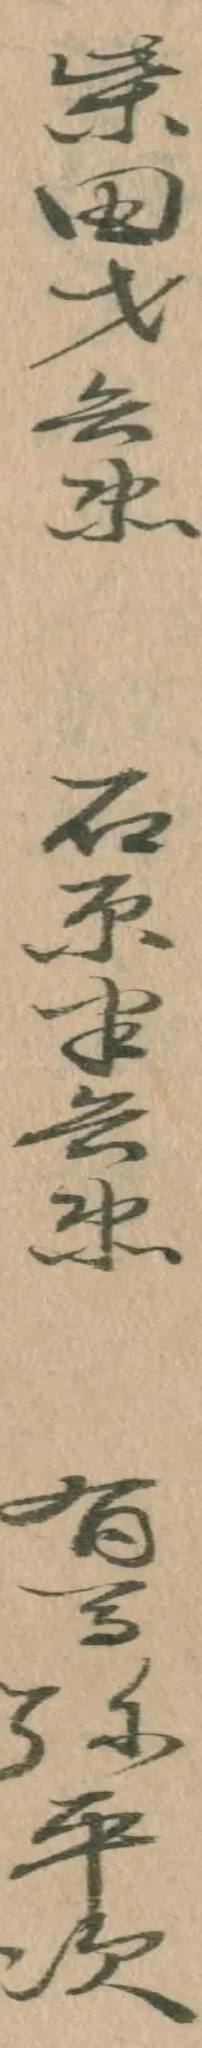柴田才兵衛石原半兵衛有馬弥平次
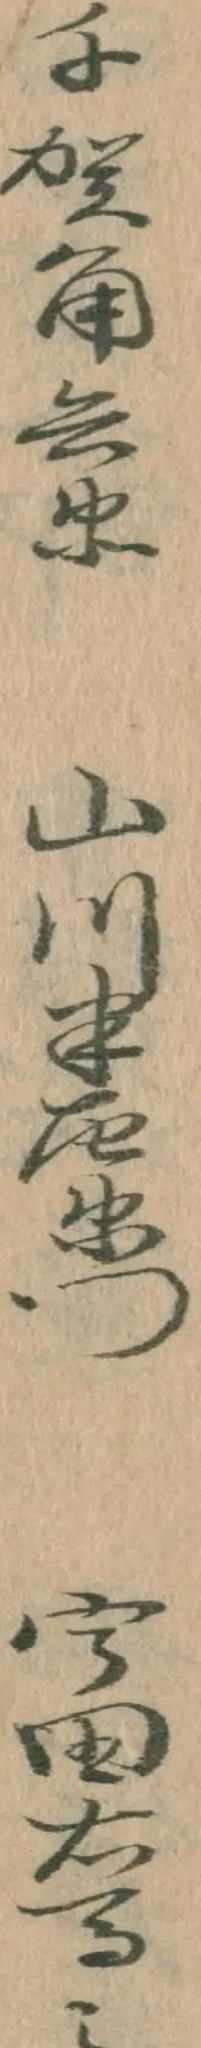千賀角兵衛山川半左衛門宇田右馬之助
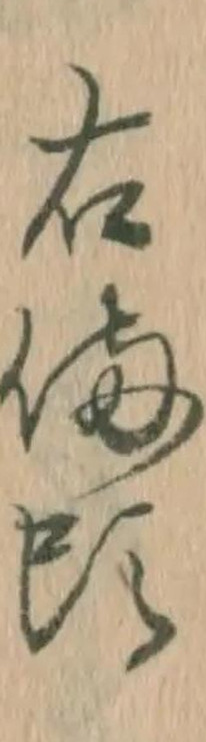右備頭
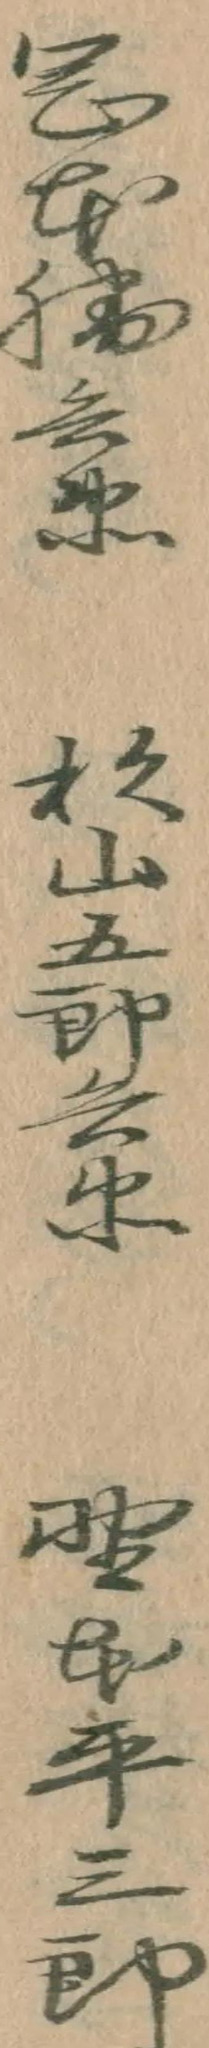岡本勝兵衛杉山五郎兵衛野本平三郎
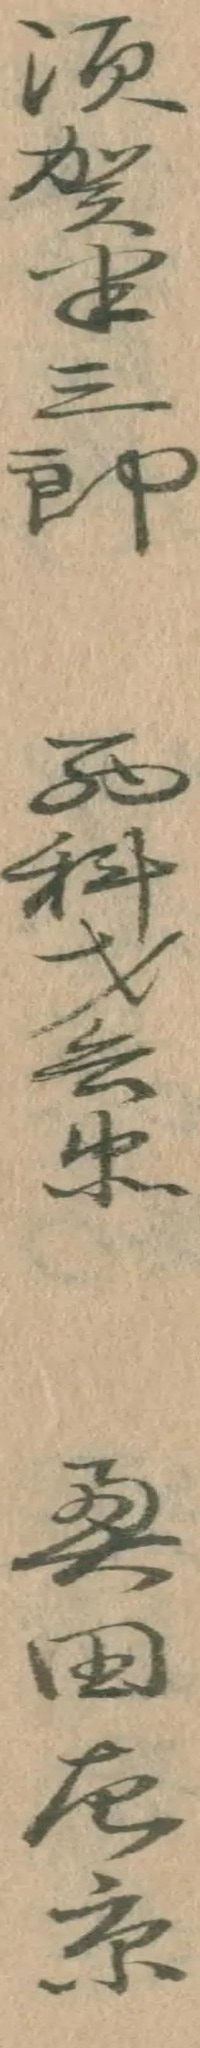須賀半三郎西科才兵衛奥田左京
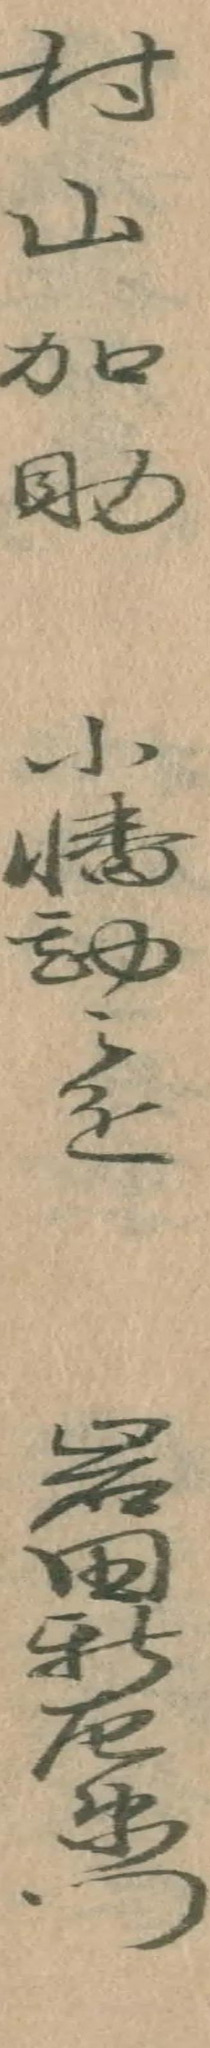村山加助小幡勘之進岩田新左衛門
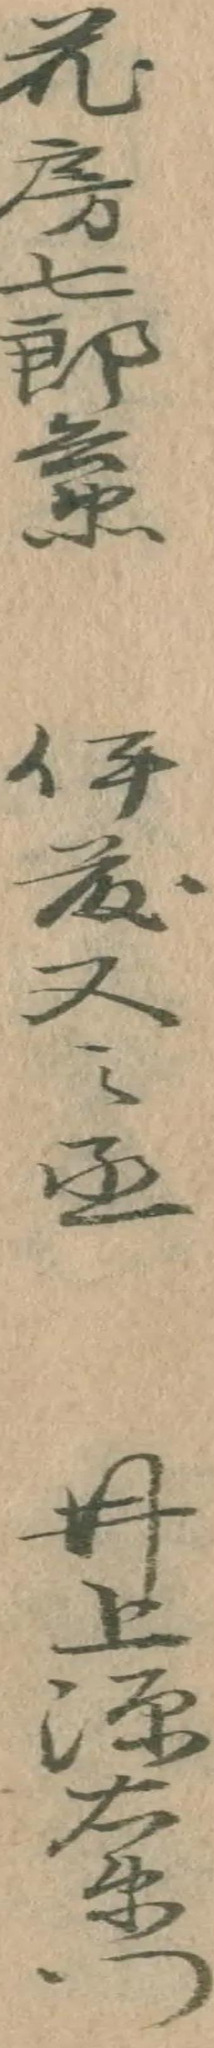花房七郎兵衛伊藤又之丞井上源右衛門
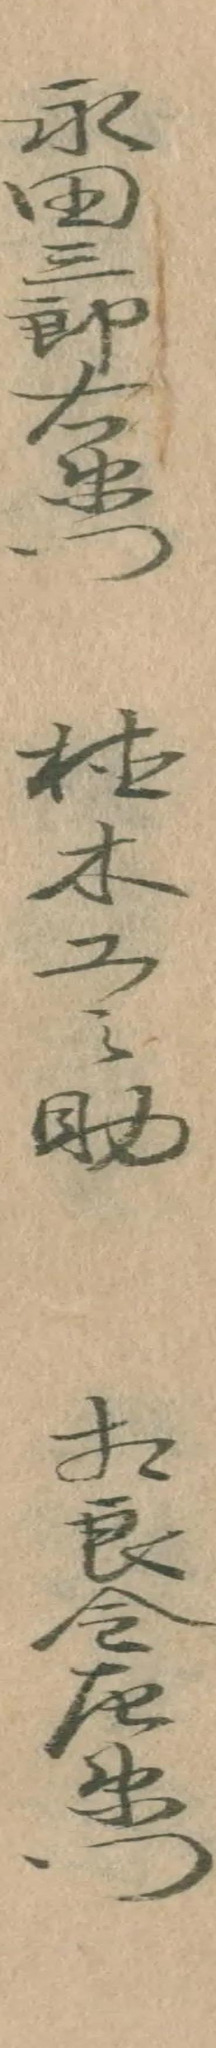永田三郎右衛門植木工之助相良金左衛門
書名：切支丹御退治記 49巻. [3]
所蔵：国立国会図書館 National Diet Library, JAPAN
